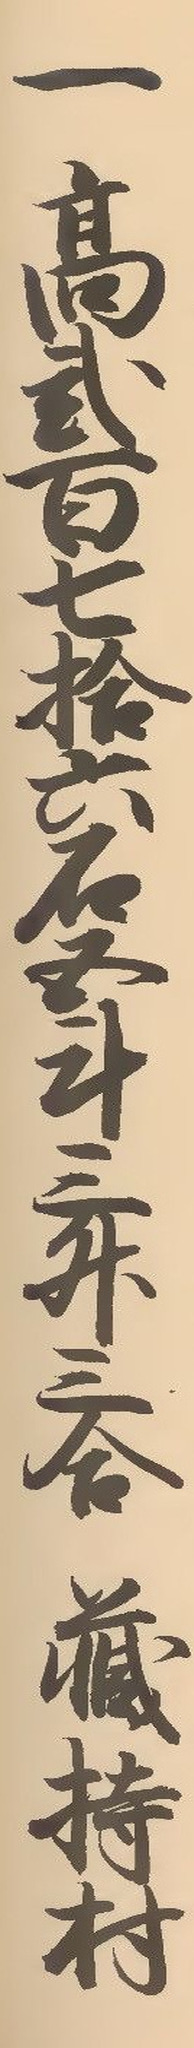一高弐百七拾六石五斗三升三合蔵持村
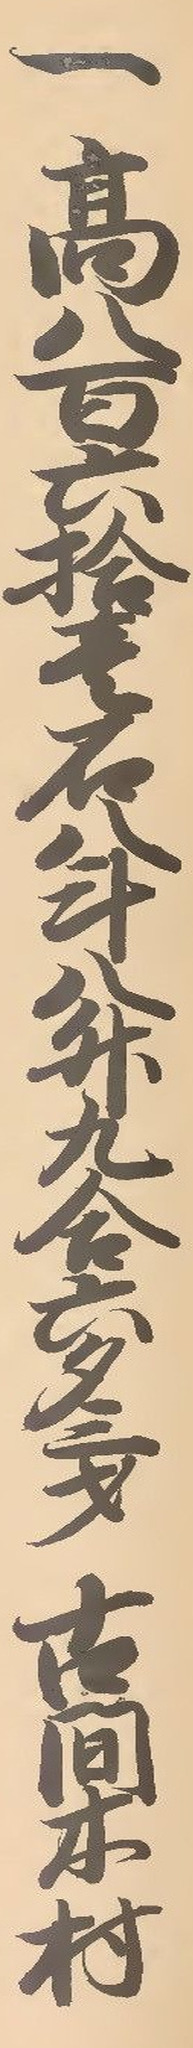一高八百六拾壱石八斗八升九合六勺三才古間木村
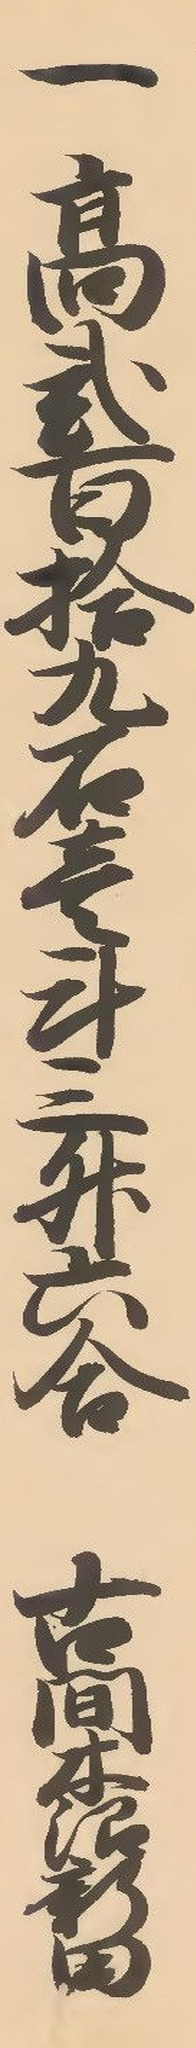一高弐百拾九石壱斗三升六合古間木沼新田
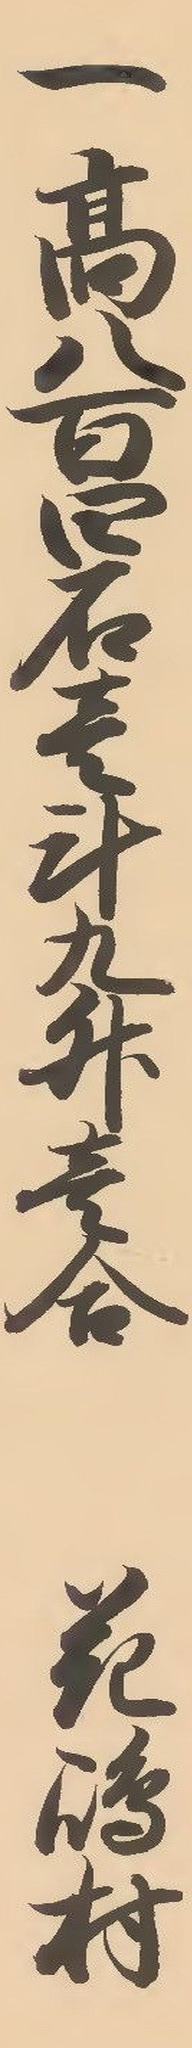一高八百四石壱斗九升壱合花島村
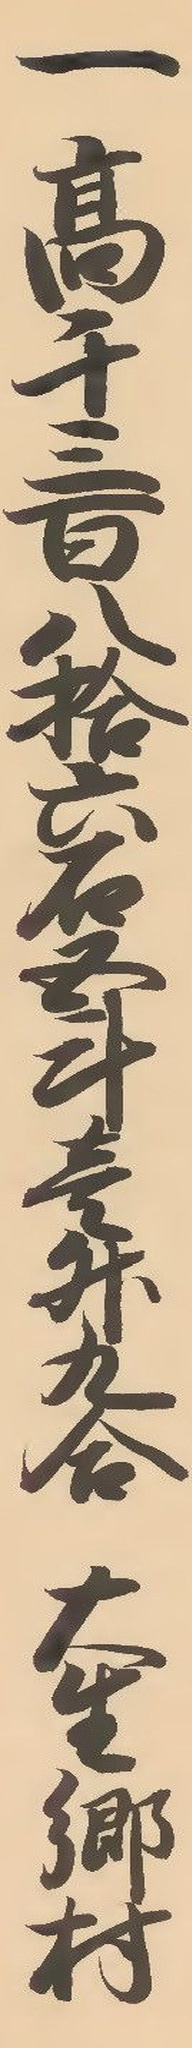一高千三百八拾六石五斗壱升九合大生郷村

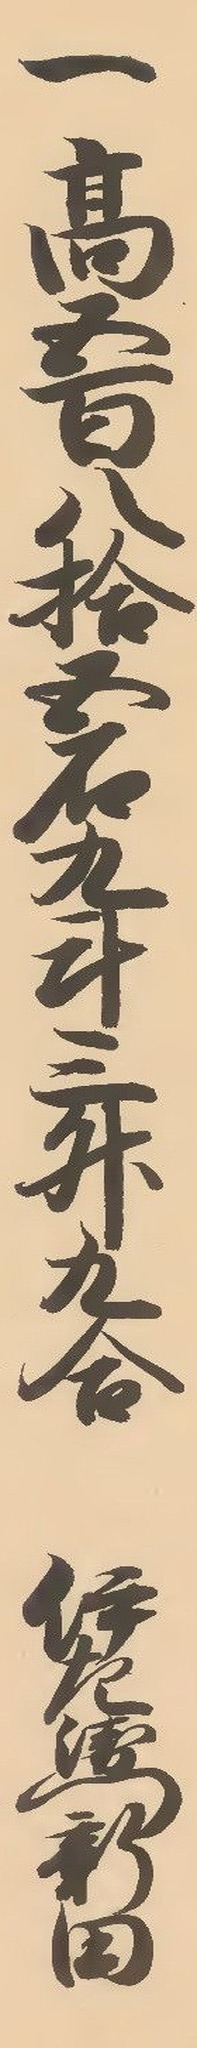一高五百八拾五石九斗三升九合伊左衛門新田
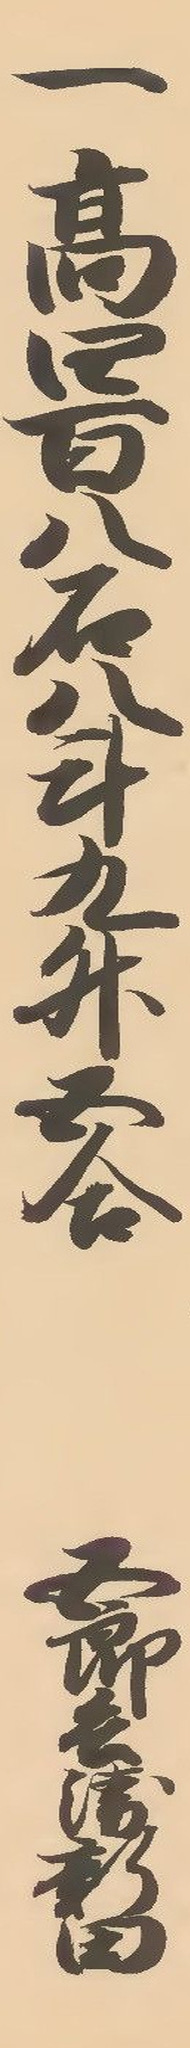一高四百八石八斗九升五合五郎兵衛新田
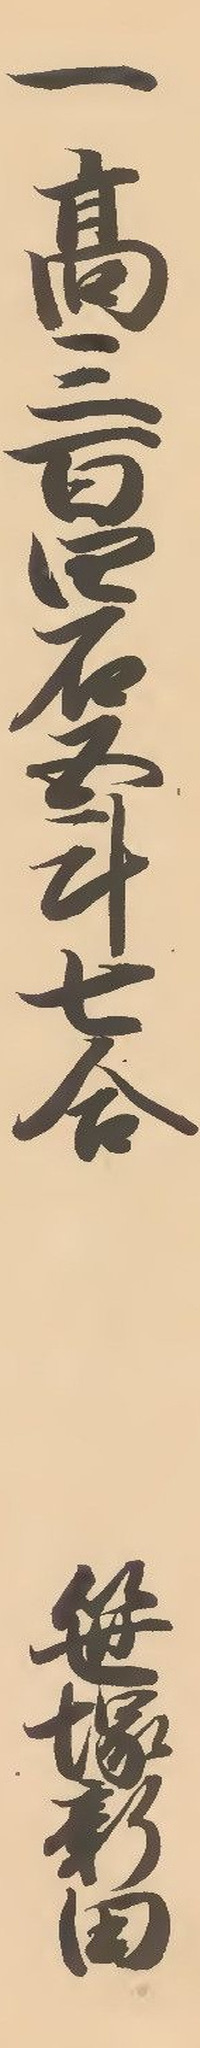一高三百四石五斗七合笹塚新田
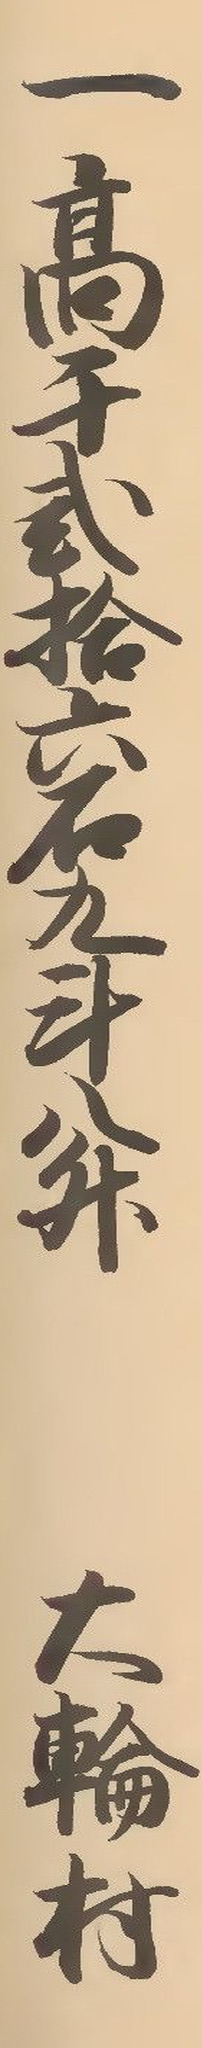一高千弐拾六石九斗八升大輪村
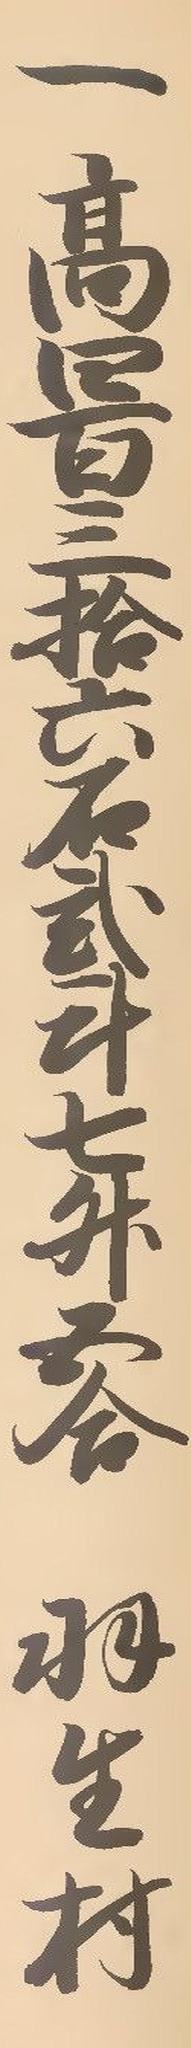一高四百三拾六石弐斗七升五合羽生村
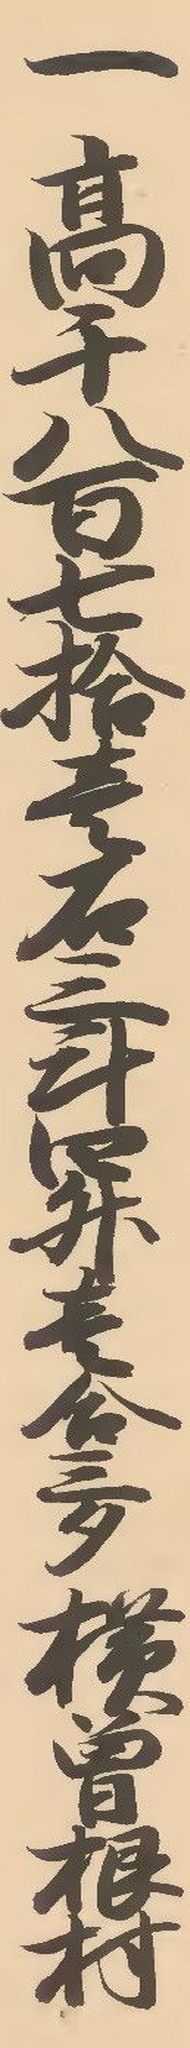一高千八百七拾壱石三斗四升壱合三勺横曽根村
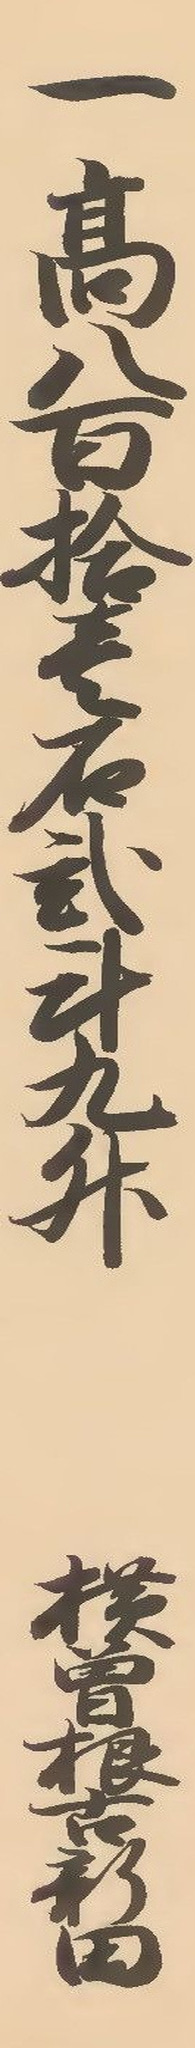一高八百拾壱石弐斗九升横曽根古新田
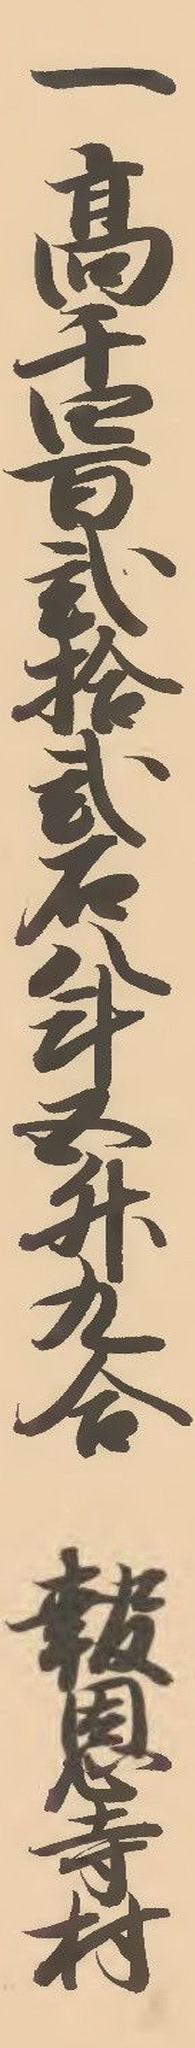一高千四百弐拾弐石八斗五升九合報恩寺村

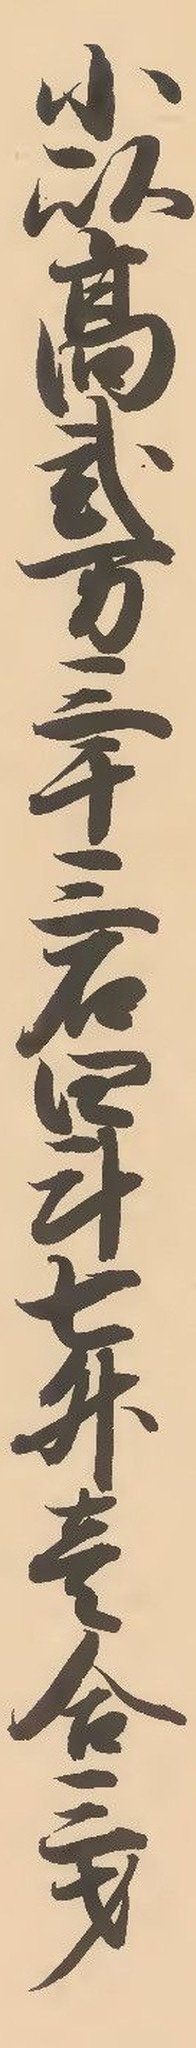小以高弐万三千三石四斗七升壱合三才
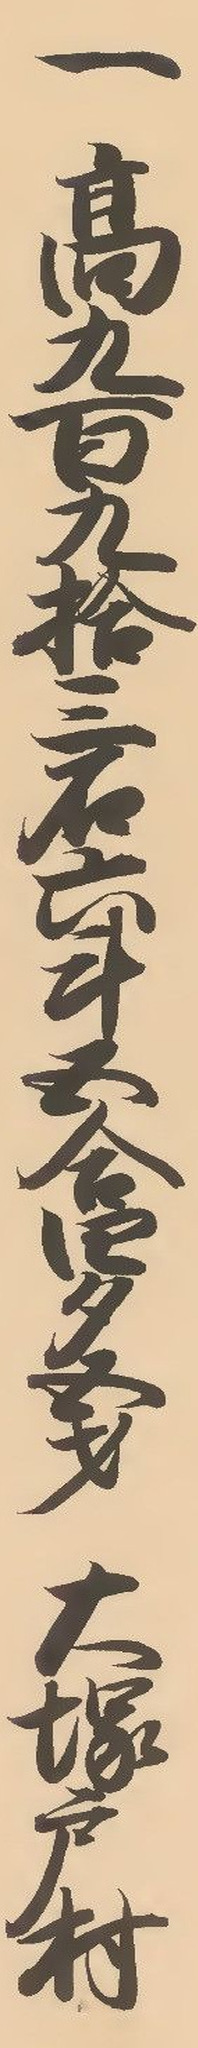一高九百九拾三石六斗五合四勺五才大塚戸村
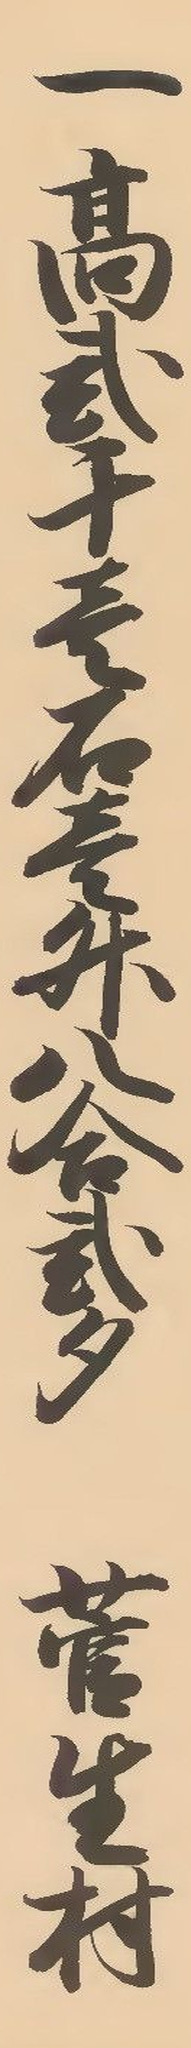一高弐千壱石壱升八合弐勺菅生村
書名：下総国郷帳
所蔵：国立公文書館 National Archives of Japan
